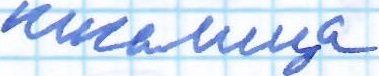пигалица
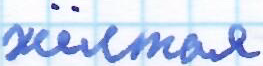жёлтая
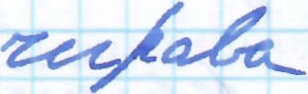чеграва
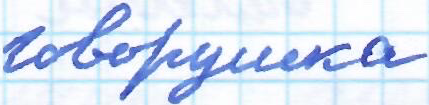говорушка
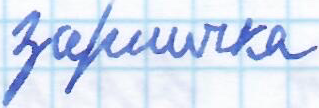зарничка
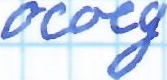осоед
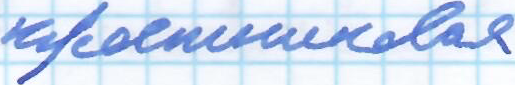тростниковая
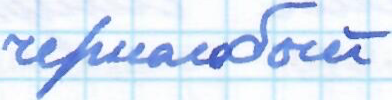чернолобый
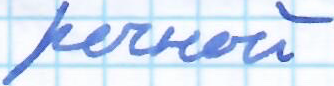речной
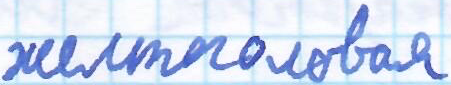желтоголовая
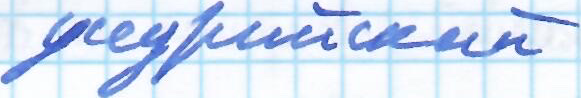уссурийский
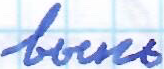выпь
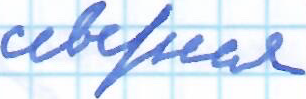северная
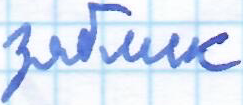зяблик
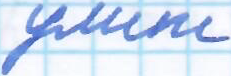улит
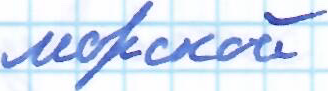морской
